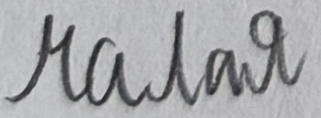малая
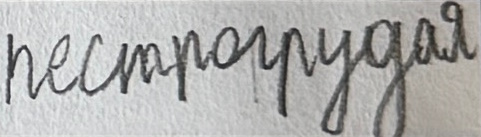пестрогрудая
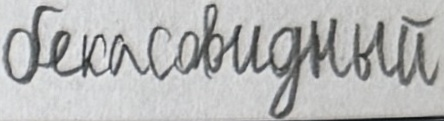бекасовидный
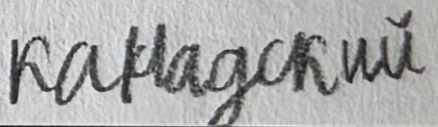канадский
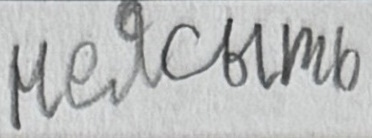неясыть
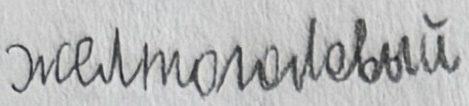желтоголевый
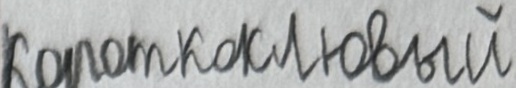копоткоклювый
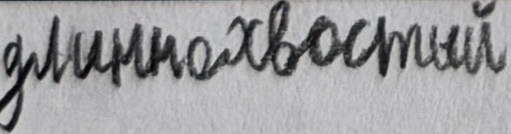длиннохвостый
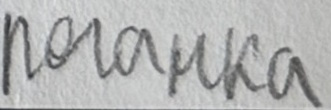поганка
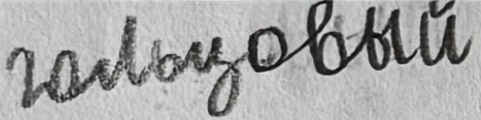гольцовый
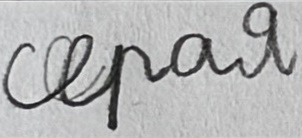серая
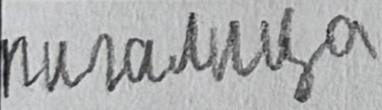пигалица
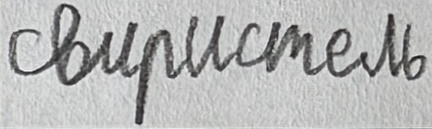свиристель
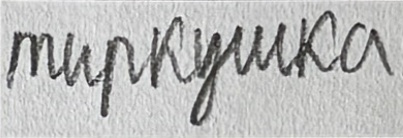тиркушка
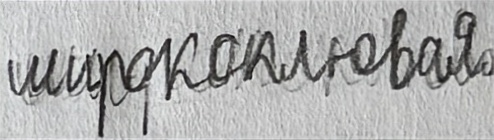ширококлювая
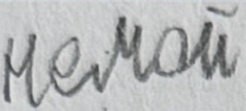немой
